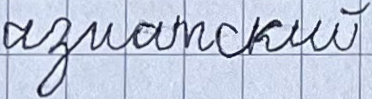азиатский
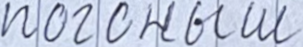погоныш
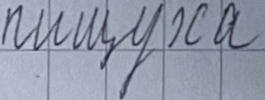пищуха
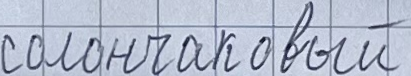солончаковый
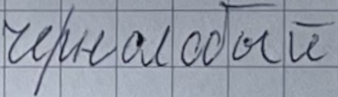чернолобый
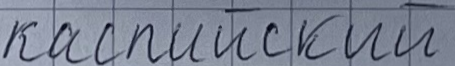каспийский
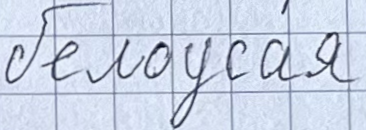белоусая
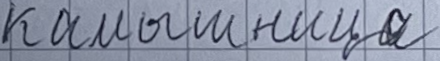камышница
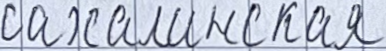сахалинская
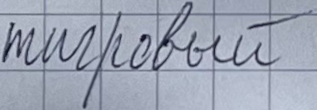тигровый
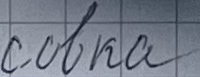совка
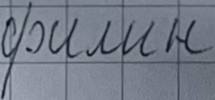филин
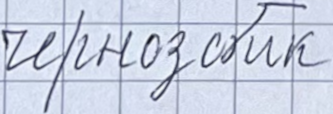чернозобик
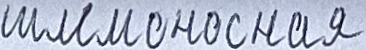шлемоносная
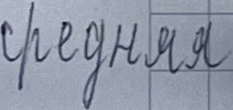средняя
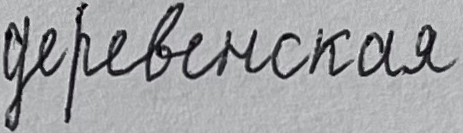деревенская
